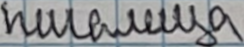пигалица
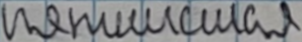пятнистая
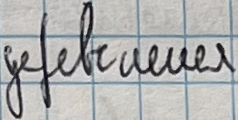деревенская
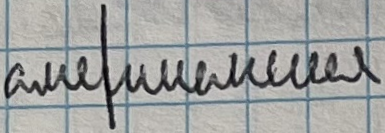американская
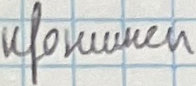кроншнеп
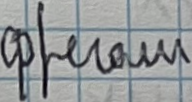фрегат
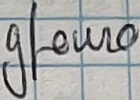дронго
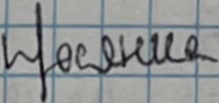просянка
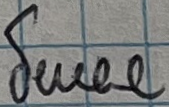бекас
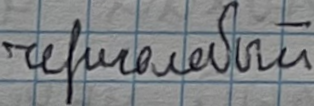чернолобый
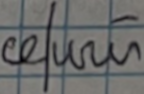серый
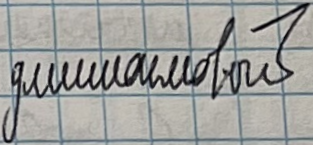длинноклювый
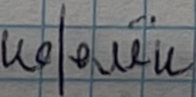королёк
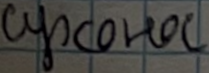сухонос
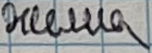желна
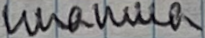ипатка
